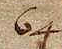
64
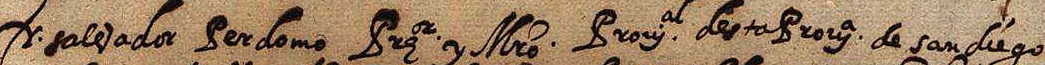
fr. salvador Perdomo Prgor. y Mrō. Prouj.al desta Prouj.a de san diego
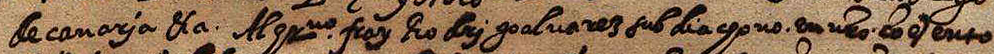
de canarja &a. Alqrno. fray Rodrjgo aluarez subdiachono Em nr̄o cōvento
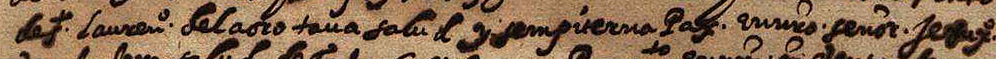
de s.to laureno. de la orotaua salud y sempiterna Pax. En nr̄o. senōr. Jesu x.o
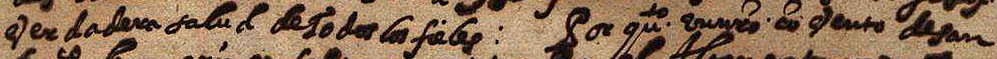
verdadera salud de Todos los fieles: Porqu.to En nr̄o. cōvento de san
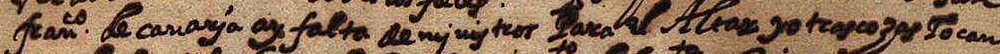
franco. de cauarja ay falta de mjnistros Para El Altar y otras cozas Tocan
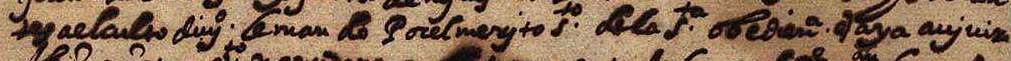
tes a el culto diuj.o le mando Por el merjto s.to de la S.ta obedien.a q̄ aya a ujuir
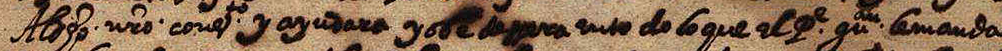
Al dh̄o. nr̄o. conv.to y ayudara y obedessera En todo lo que El P.e gu.am le manda
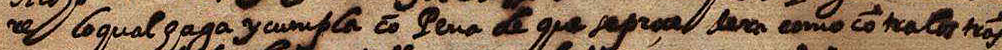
ra lo qual haga y cumpla cō Pena de que se procedera como cōtra los trās
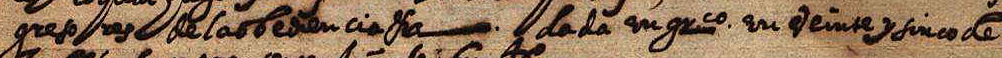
gresores de la obediencia &a. dada En gr.co En Veinte y sinco de
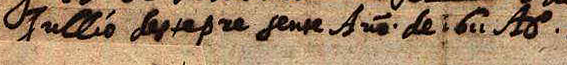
Jullio deste presente Anō. de 611 Aso.
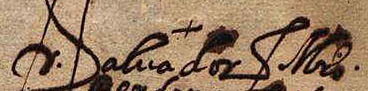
fr. Saluador Mrō.
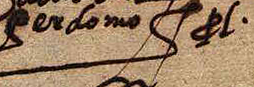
perdomo ꝓl.
